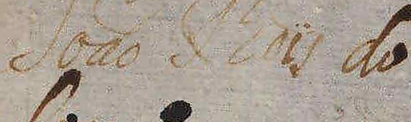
Joaõ Rois do
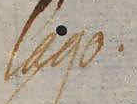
lago.
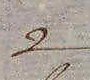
2
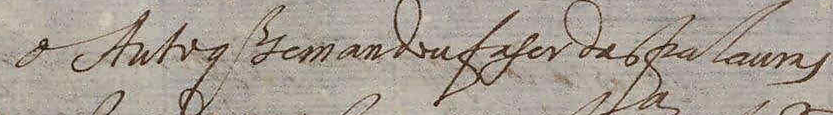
o Auto q̄ se mandou faser das palauras
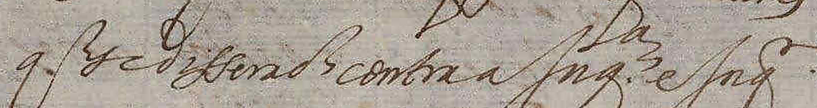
q̄ se disseraõ contra a Jnq.aõ e Jnq.res
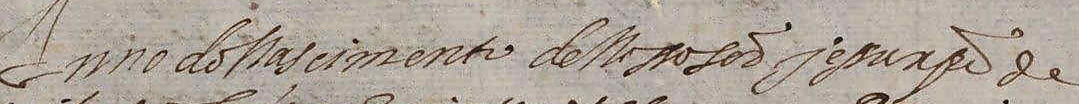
Anno do nascimento de Nosso sōr Jesu xpō de
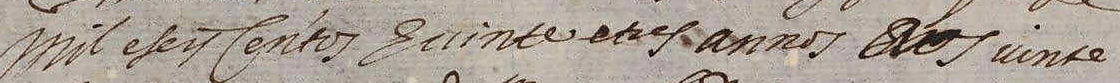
mil e seisCentos E uinte e tres annos aos uinte
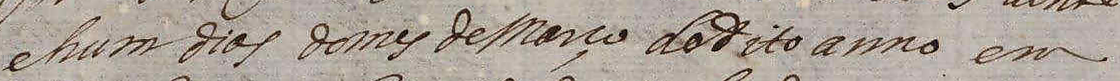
e hum dias do mes de Março do dito anno em
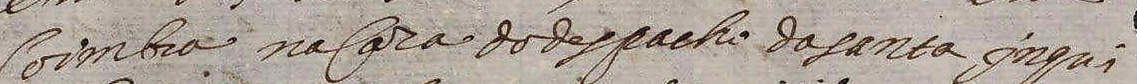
Coimbra na Caza do despacho da santa jnqui
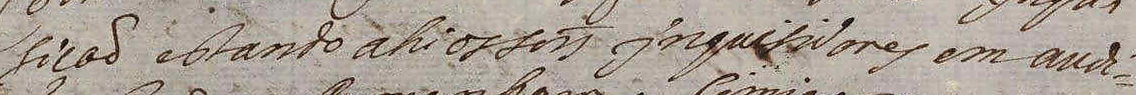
sição estando ahi os sōrs Jnquisidores em audi
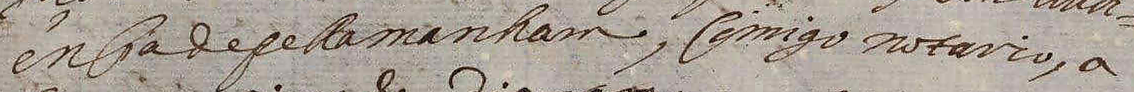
enCia de pella manham, Comigo notario, a
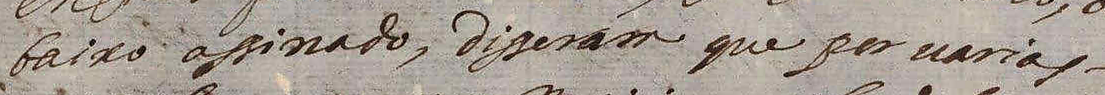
baixo assinado, disseram que por uarias
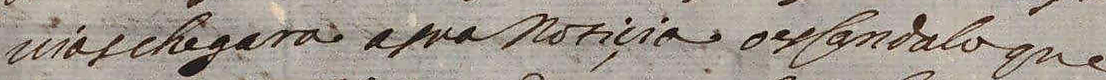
uias chegara a sua noticia o escandalo que
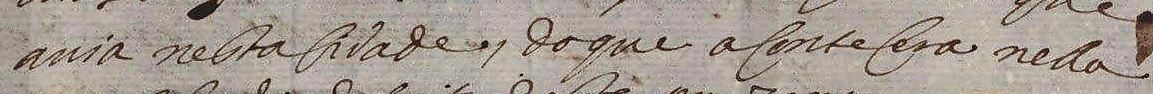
auia nesta Cidade, do que acontecera nella
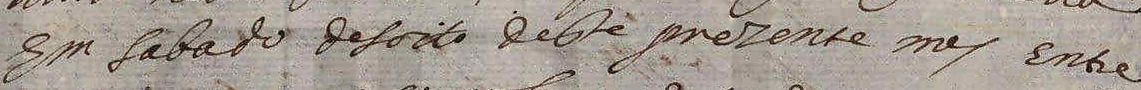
Em sabado desoito deste prezente mes entre
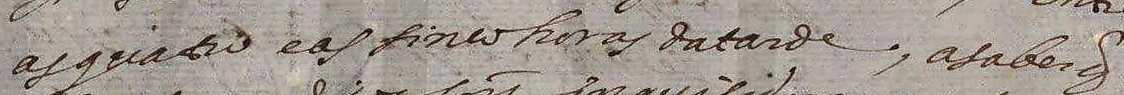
as quatro e as sinco horas da tarde, a saber q̄
